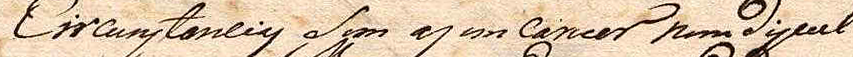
Circunstancias sem as emcarecer nem discul
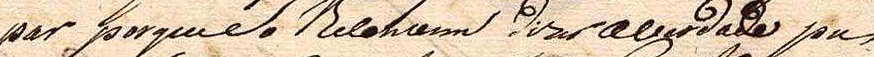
par porque so lhe convem dizer a verdade pa
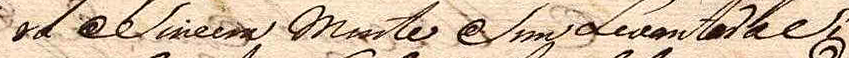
ra e Sinceramente Sem Levantar a si
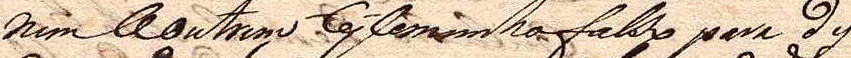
nem a outrem testemunho falso para des
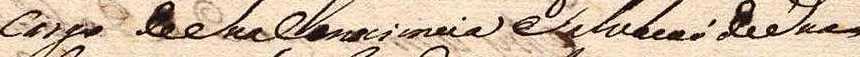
cargo de sua consciencia salvacaõ de sua
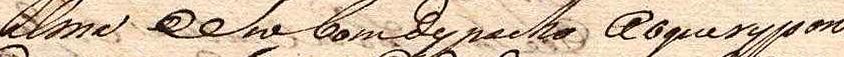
alma e Seo bom despacho ao que respon
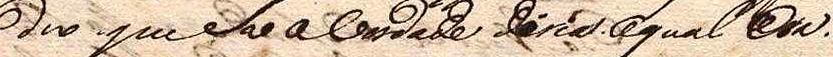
deo que so a verdade diria a qual era.
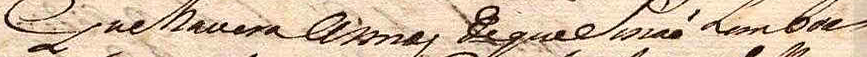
Que hauera annos de que Se naõ Lembra
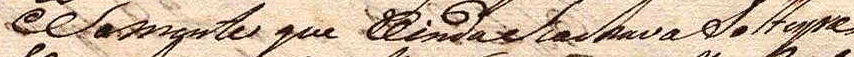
e Somente que ainda Se achava Solteyra
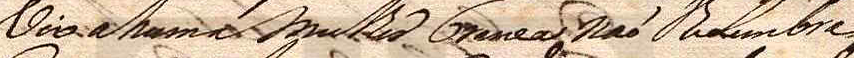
Vio a huma Mulher branca naõ lhe Lembra
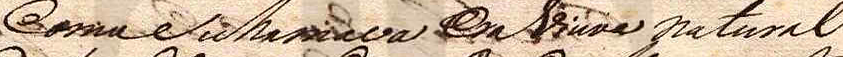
Como se chamava era Viuva natural
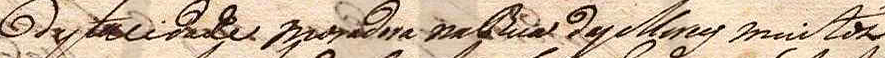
desta cidade moradora na Rua das Merces muitoz
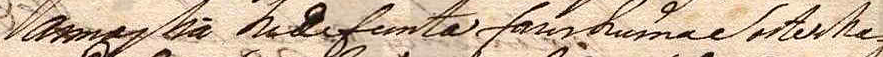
annos há he defunta fazer huma sorte cha
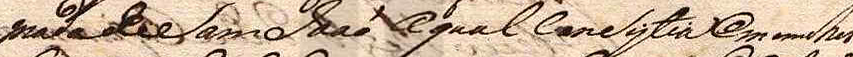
mada de Sam Ioaõ a qual consistia em emcher
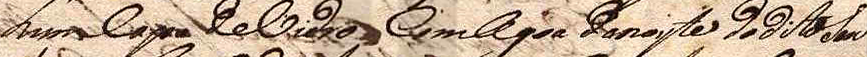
hum Copo de Vidro Com Agoa da noyte do dito San
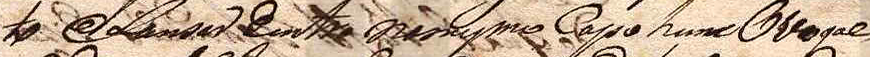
to e Lansar dentro no mesmo Copo hum Ovo que
